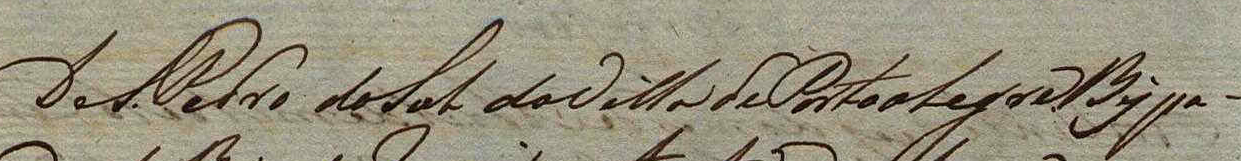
De S. Pedro do Sul da Villa de Porto alegre Bispa
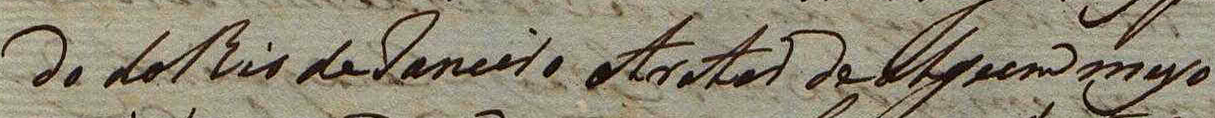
do do Rio de Ianeiro a tratar de algum meyo
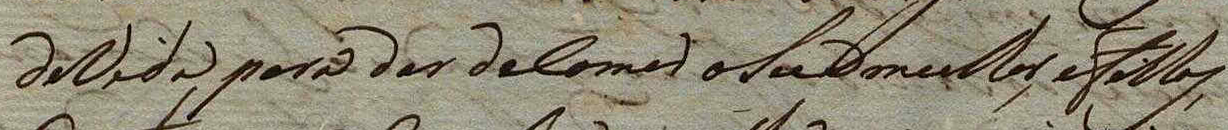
de Vida para dar de Comer a Sua mulher, e filhos,
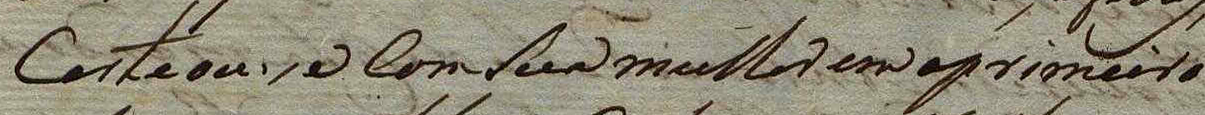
Carteou-se Com Sua mulher em o primeiro
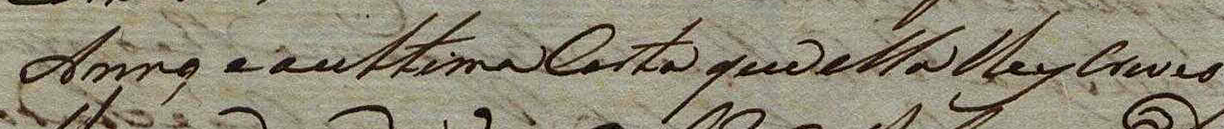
Anno, e a ultima Carta que ella lhe esCreveo
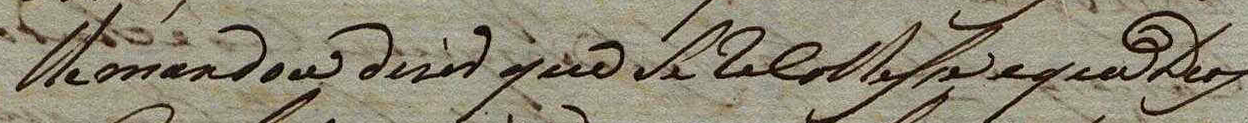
lhe mandou dizer que Se ReColhesse, e que Deos
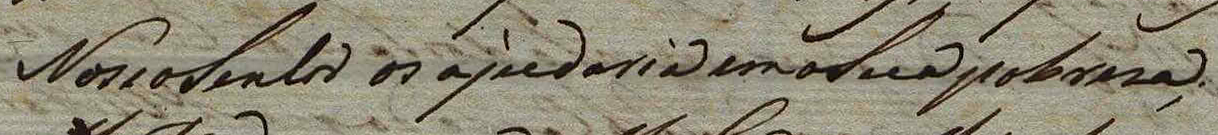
Nosso Senhor os ajudaria em a Sua pobreza;
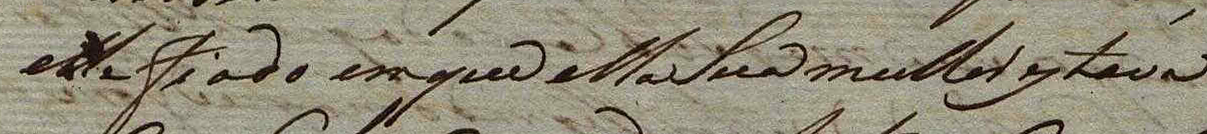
elle fiado em que ella Sua mulher estava
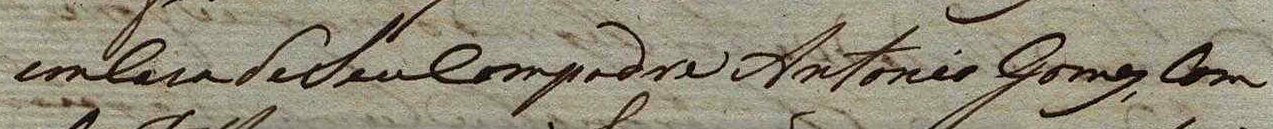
em Caza de Seu Compadre Antonio Gomes, Com
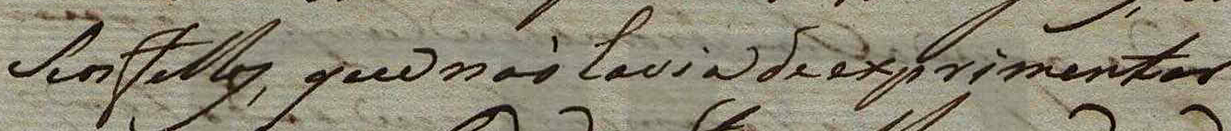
Seos felhos, que naõ havia de exprimentar
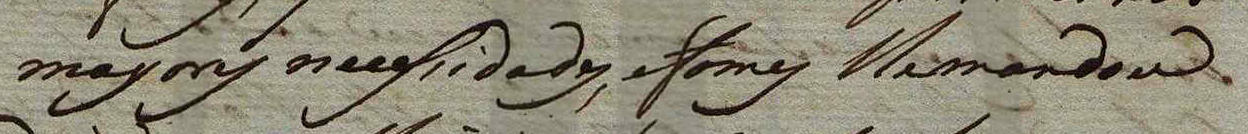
mayores necessidades, e fomes lhe mandou
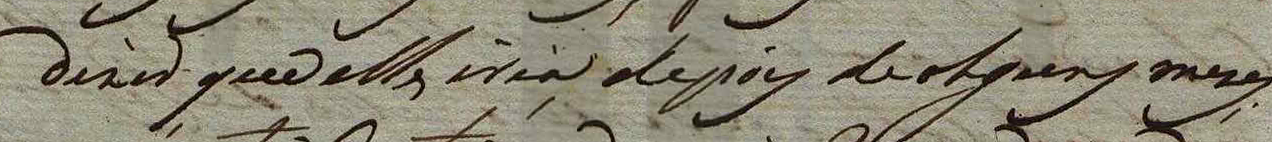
dizer que elle iria, depois de alguns mezes;
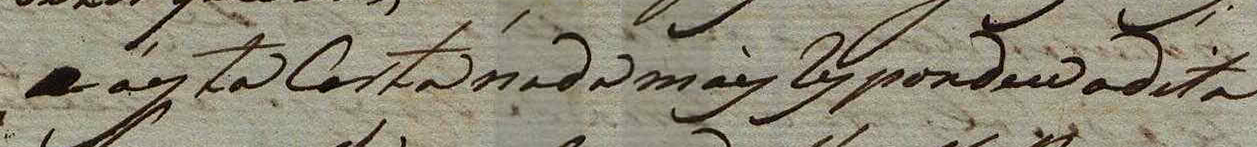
_ á esta Carta nada mais Respondou a dita
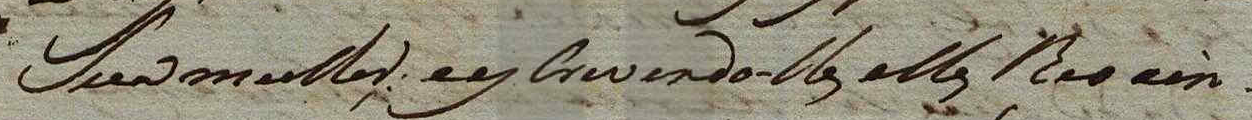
Sua mulher; e esCrevendo-lhe elle Reo ain
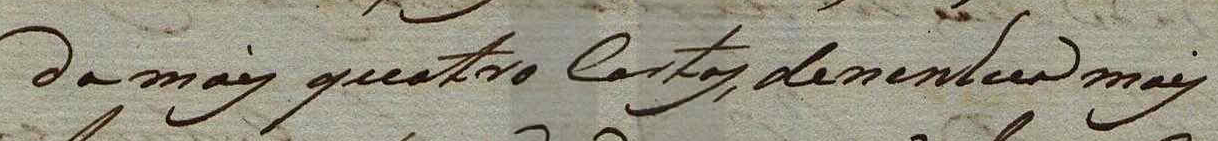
da mais quatro Cartas, de nenhua mais
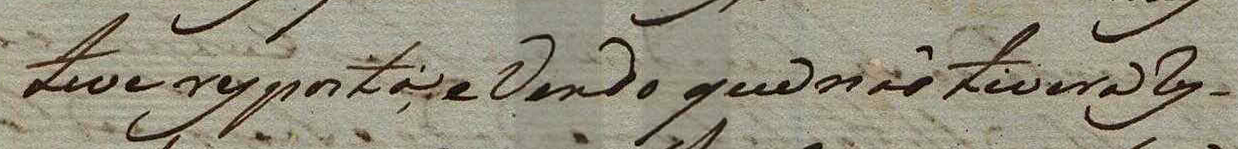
teve resposta, e Vendo que naõ tivera Res
